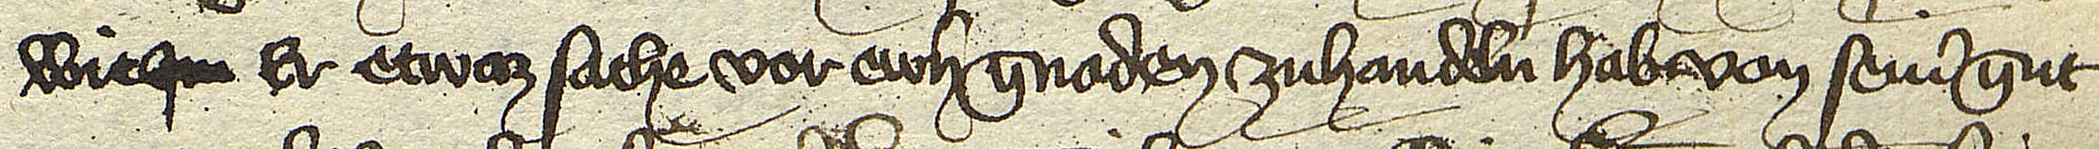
wie Im Er etwaʒ ſache vor ewn* gnaden cʒehandeln hab von ſein* gut
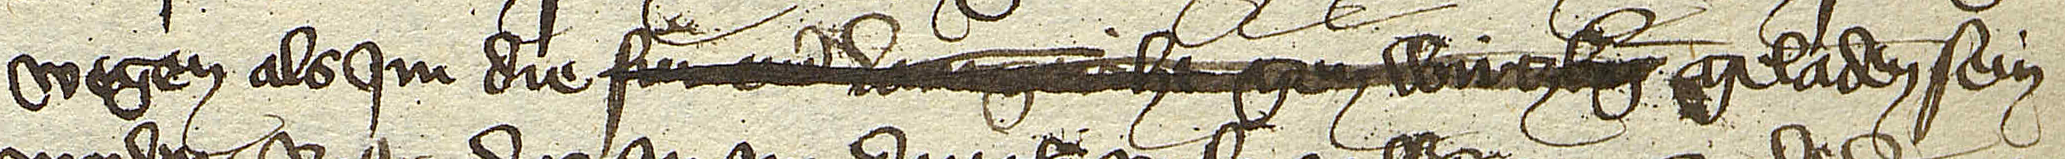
wegen als Im die für ew* lantgeriht gen wirtʒb*g geladen ſein
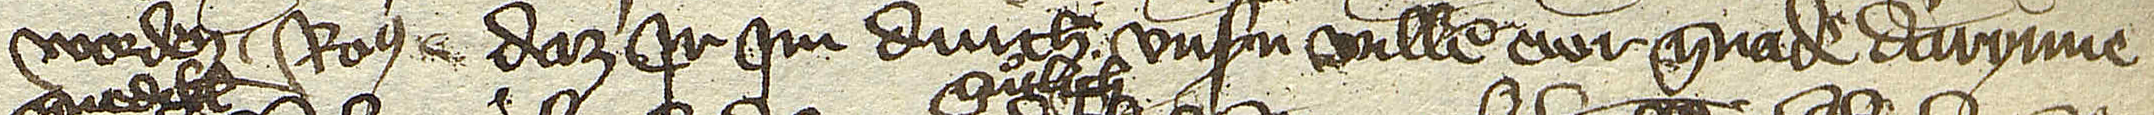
worden / Ro* / daʒ Ir Im durch vnſ*n wille* ewr gnade darynne
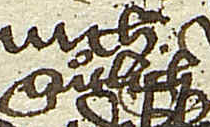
gütlich
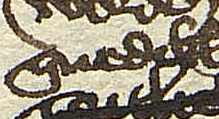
gnedikl*
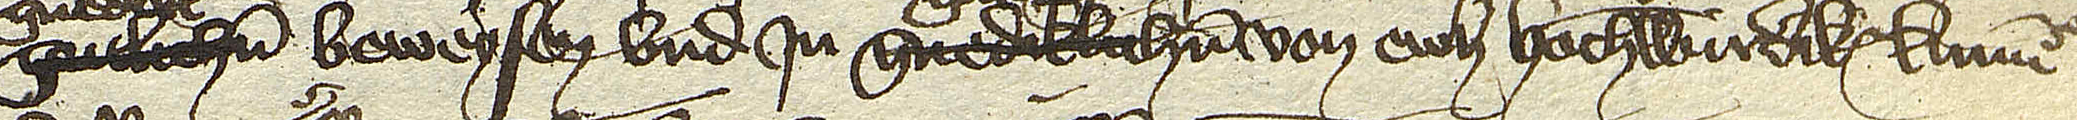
gutichn* beweyſen vnd In gnediklichn* von ewn* hochwirdik* kume*
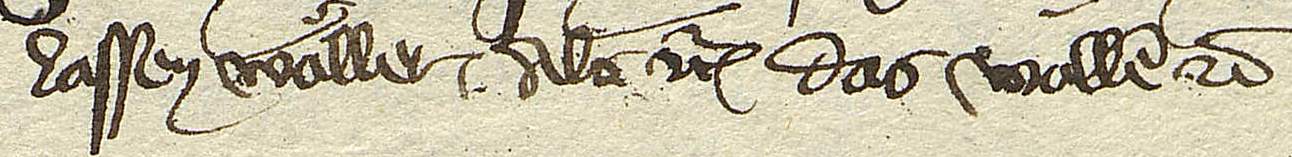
laſſen wöllet / Als ec* das wölle* ec*
